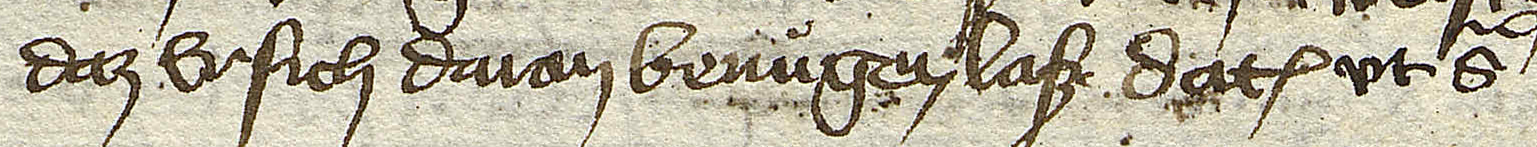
daʒ Er ſich dauon benügen laſʒ . Dat* vt S*
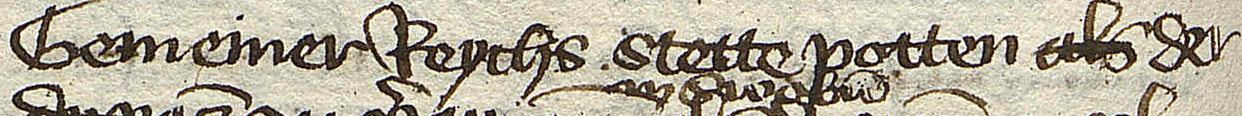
Gemeiner Reychs . Stette potten als der
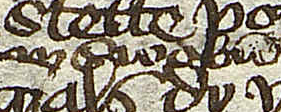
in Swabn*
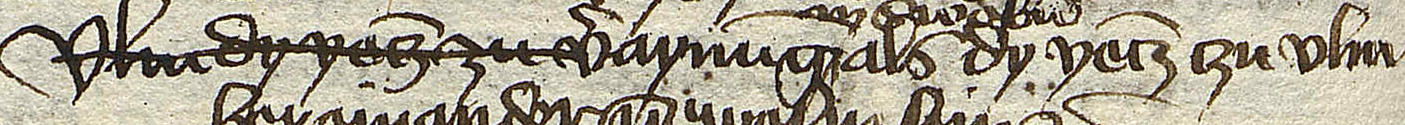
Vlm dy yecʒ* cʒu v*aynu*g als dy yecʒ* cʒu vlm
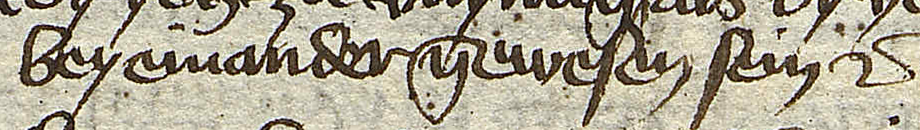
beyeinander geweſen ſein ec*
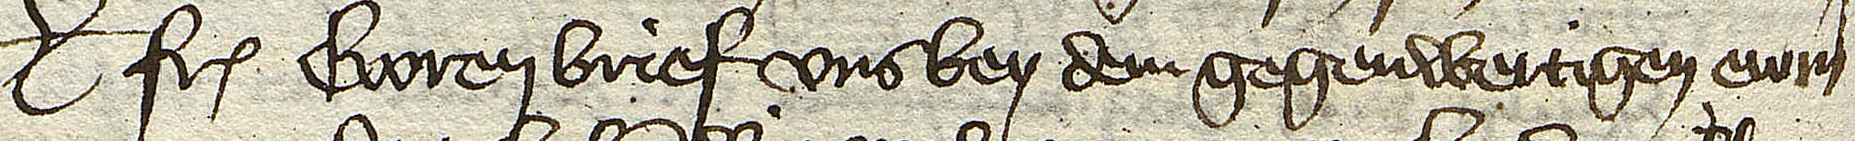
L* fr* Ewren brief vns bey dem gegenwertigen ewm*
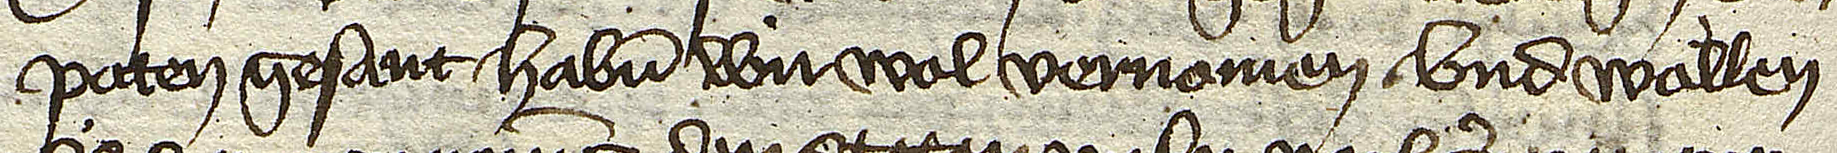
poten geſant / hab*n wir wol vernomen / Vnd wöllen
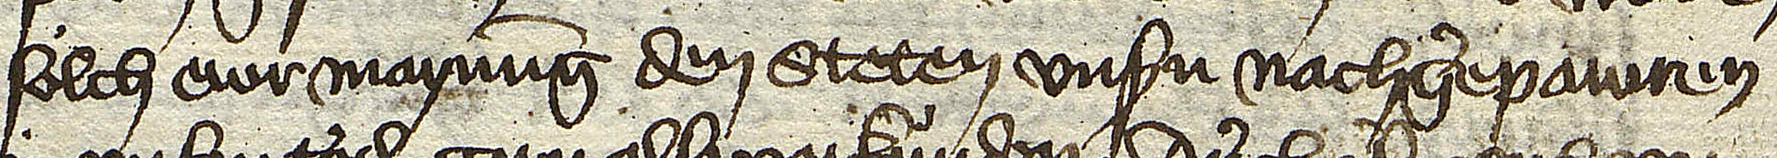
ſölch ewr maynu*g den Steten vnſ*n nachgepawren
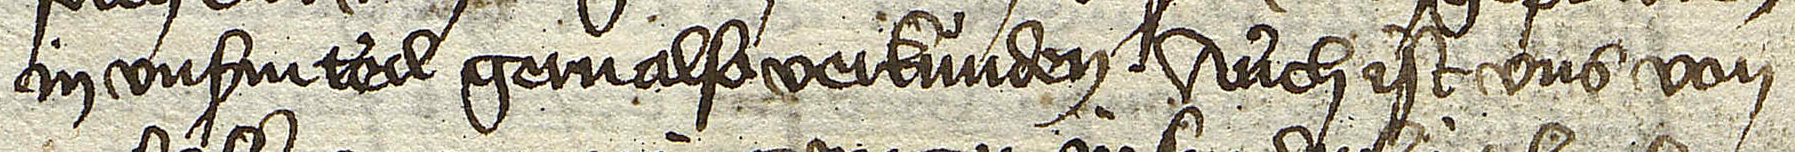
in vnſ*m teil gern alſo verkünden . Auch iſt vns von
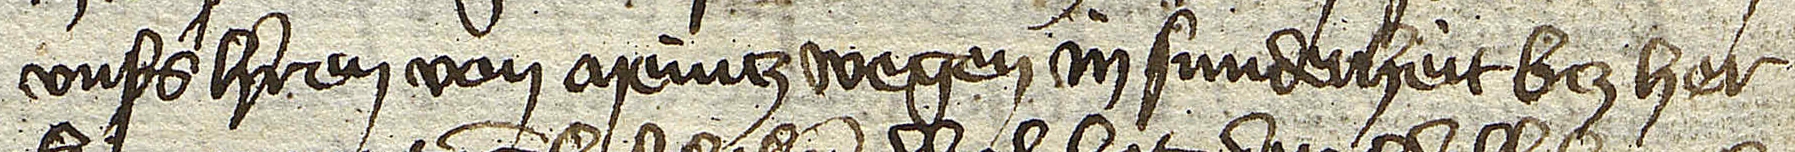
vnſ*s h*ren von Meincʒ wegen in ſunderheit biʒ her
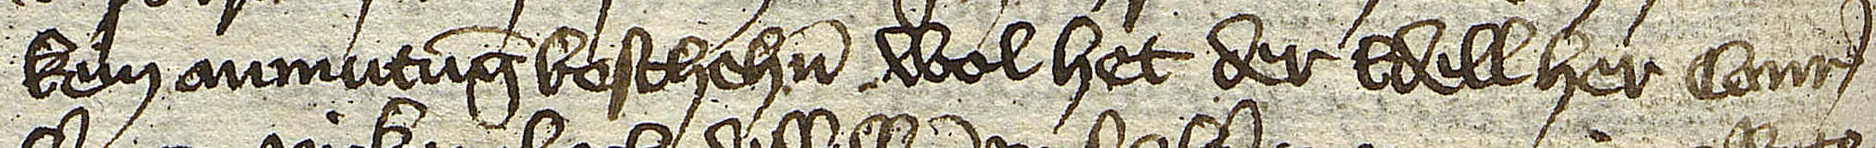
kein anmutu*g beſcheh*n . wol het der Edell her Conr*
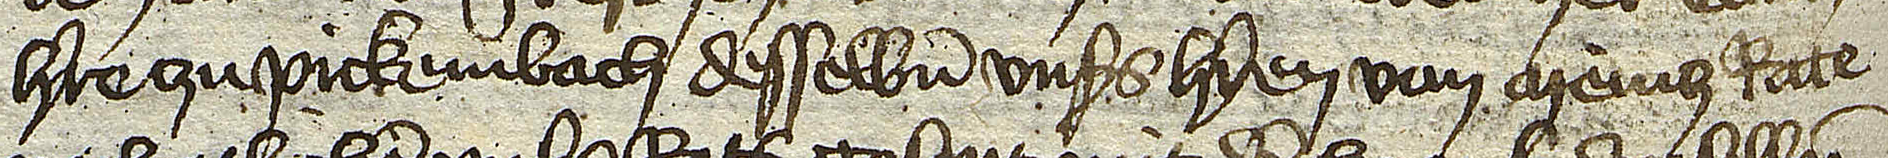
h*re cʒu pickembach deſſelb*n vnſ*s h*ren von Meincʒ Rate
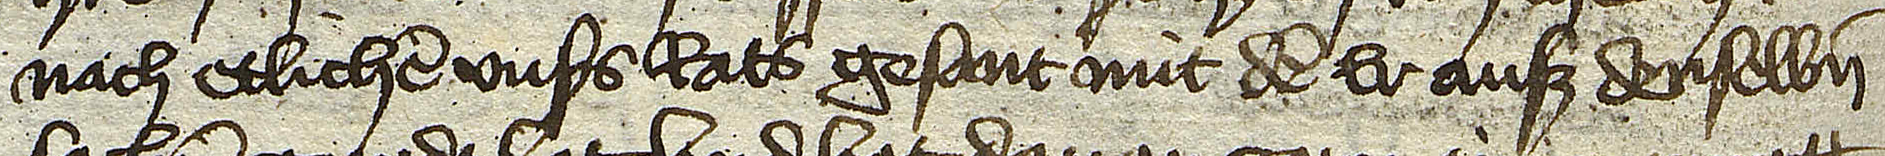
nach etliche* vnſ*s Rats geſant mit de* Er auſʒ denſelb*n
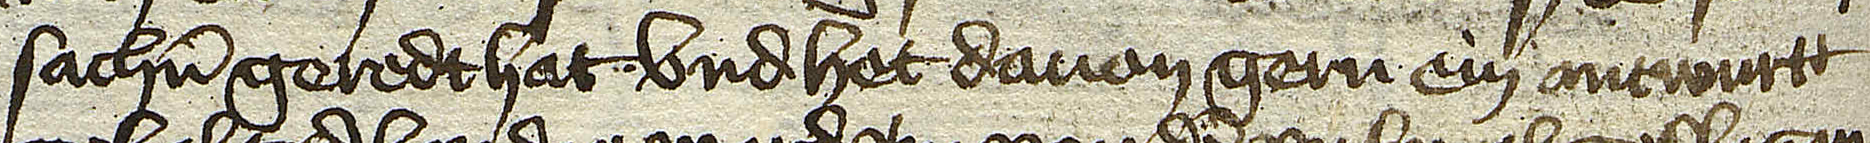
ſach*n geredt hat . Vnd het dauon gern ein antwurtt
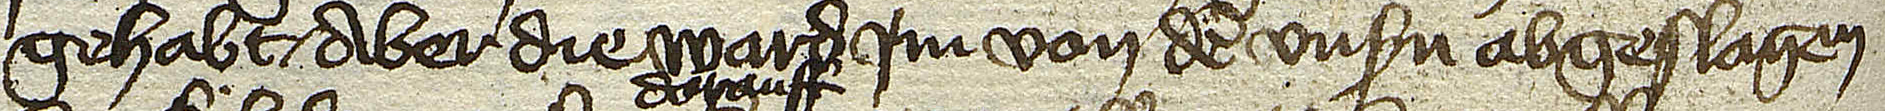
gehabt / Aber die ward Im von de* vnſ*n abgeſlagen
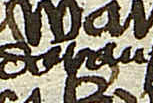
darauff
